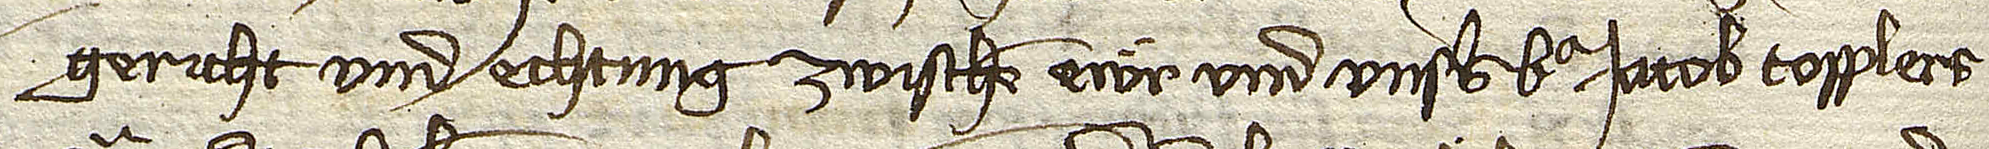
gericht vnd echtung ʒwiſche* eẅr vnd vnſ*s b* Iacob topplers
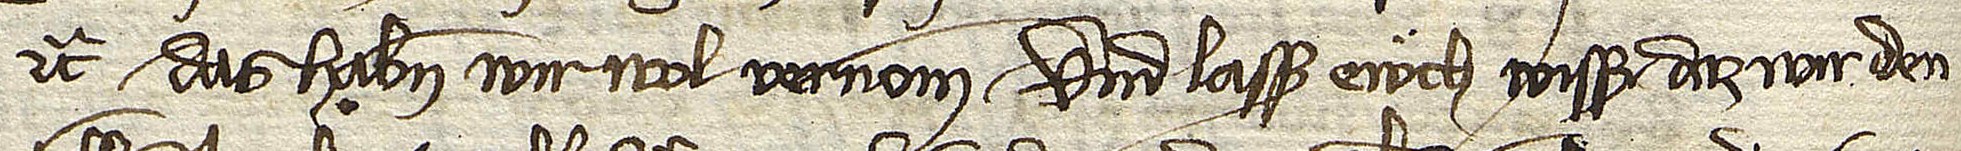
ec* / das habn* wir wol vernom* / Vnd laſſ* eẅch wiſſ* / daʒ wir den
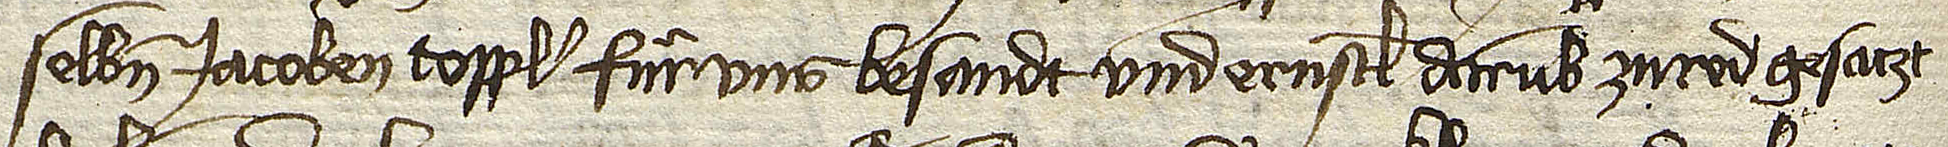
ſelbn* Iacoben toppl* für vns beſandt vnd ernſtl* darub* ʒured geſacʒt
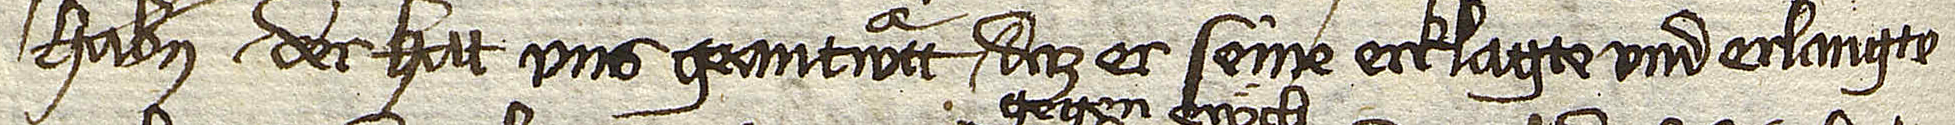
habn* / Der hat vns geantw*tt / daʒ er ſeine erklagte vnd erlangte
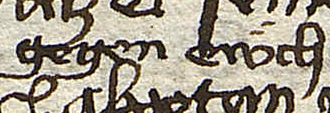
gegen eẅch
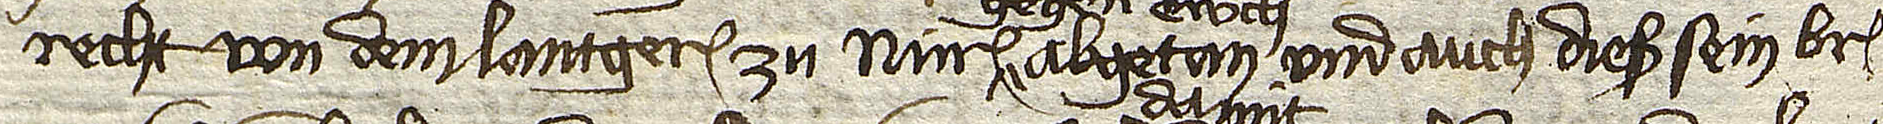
recht von dem lantger* ʒu Nür* abgetan vnd auch dieſ* ſein br*
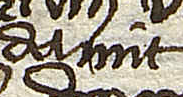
damit
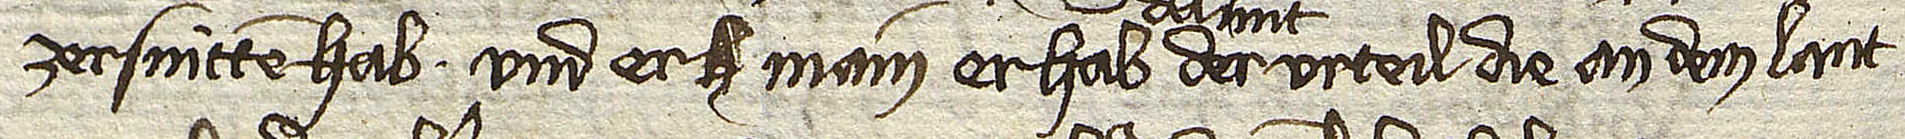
ʒerſnitte* hab . vnd er h main* er hab der vrteil die an dem lant
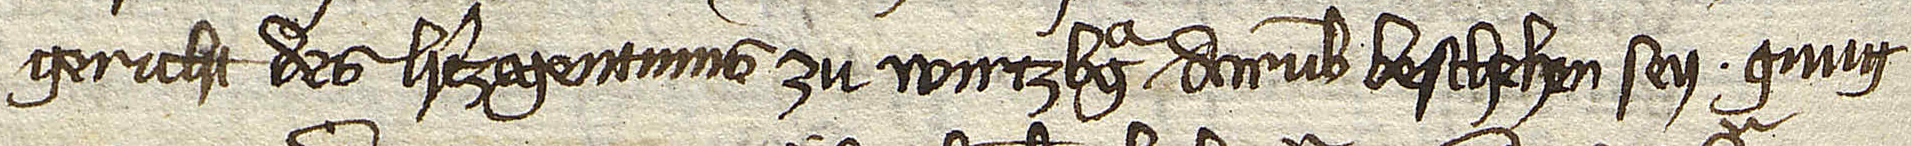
gericht des h*cʒogentums ʒu wircʒb*g / darub* beſchehen ſey . gnug
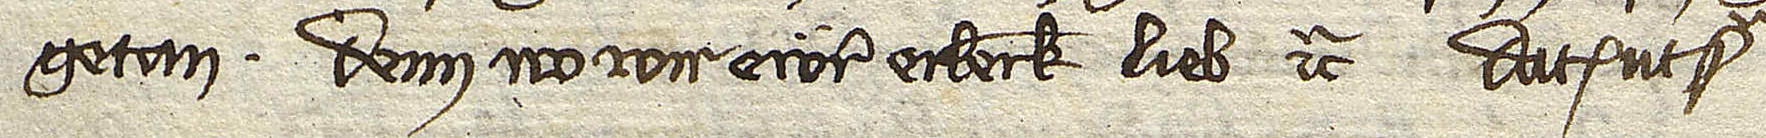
getan . Denn wo wir eẅr* erberk* lieb ec* Dat* ut ſ*
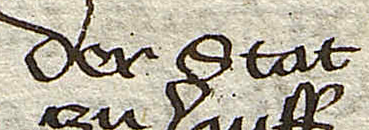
Der Stat
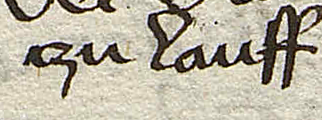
cʒ lauff
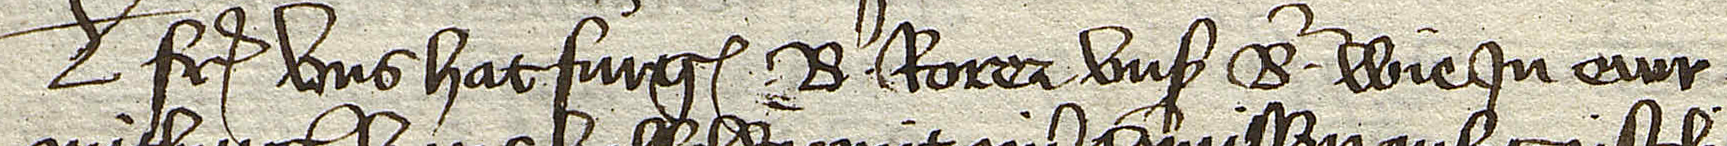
L* fr* Vns hat fürg* B* Rorer vnſ* B* . wie In ewr
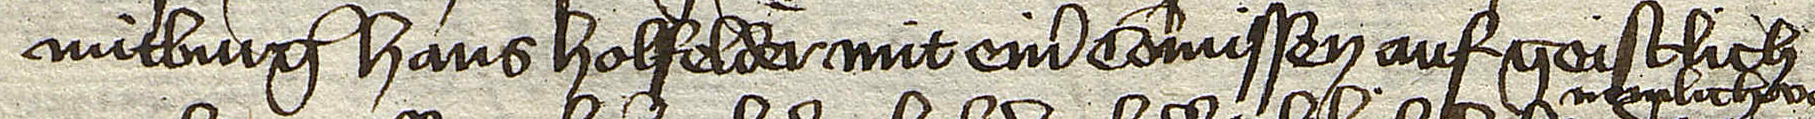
mitburg* Hans holfelder mit ein* Com*iſſen auf geiſtlich
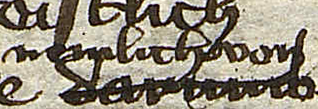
nemlich von
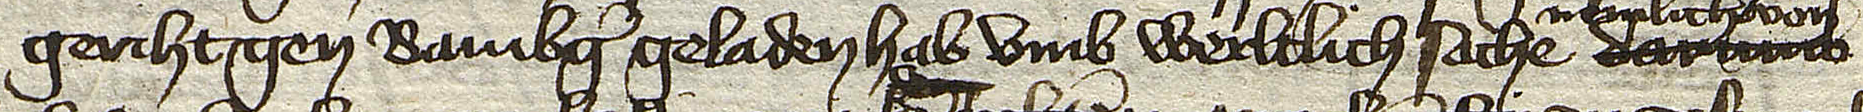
geriht gen Bamb*g geladen hab vmb werltlich ſache darumb
